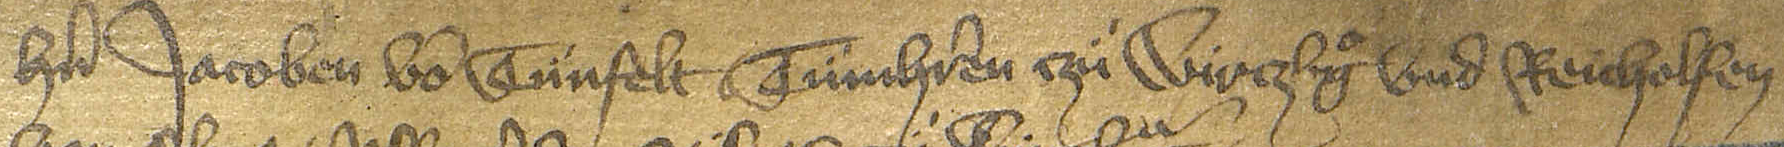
hn* Iacoben vo* Tünfelt Tümhr*en cʒü Wircʒbg* vnd Reicholfen
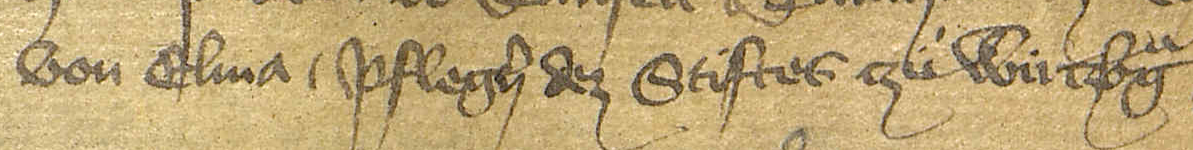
von Elma / Pfleg*n deʒ Stiftes cʒü Wirccʒbg*
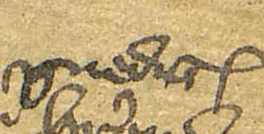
gnedig*
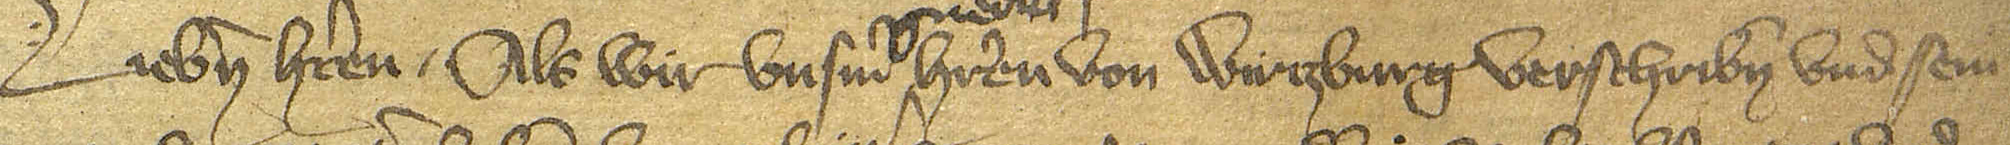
Liebn* hr*en / Als wir vnſm* hr*en von Wircʒburg verſchribn* vnd ſein
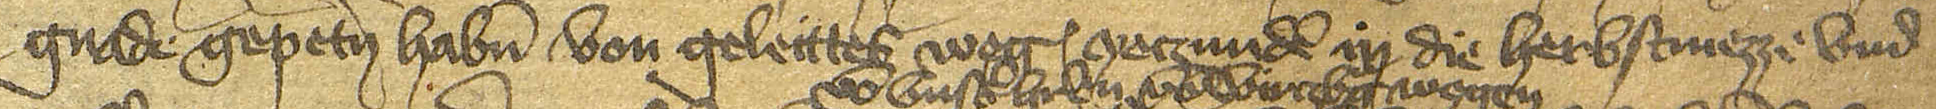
gnade gepetn* habn* / von geleittes weg* yecʒunde* in die herbſtmeʒʒe vnd
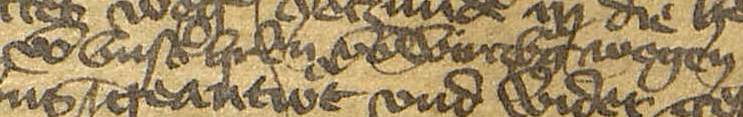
vo* vnſs* hr*en vo* wircʒbg* wegen
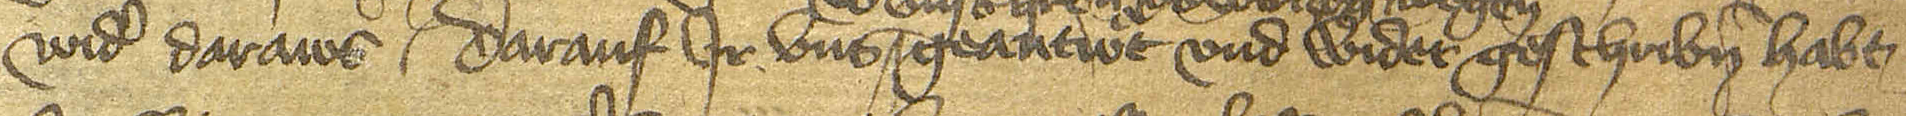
wid* daraws / Darauf Ir vns geantw*t vnd wider geſchribn* habt
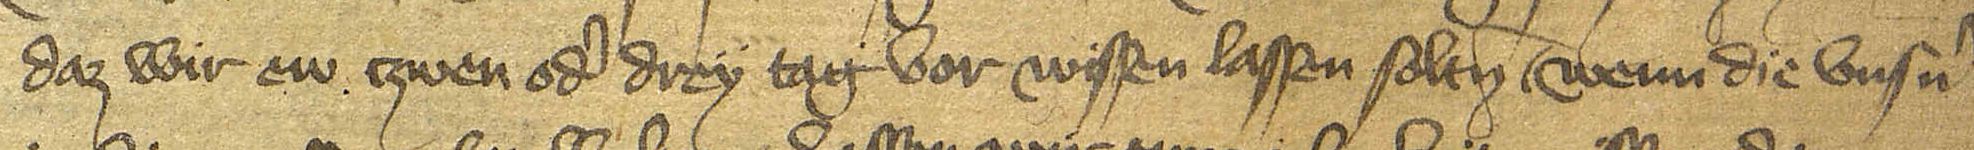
daʒ wir ew cʒwen od* drey tag vor wiſſen laſſen ſoltn* / wenn die vnſn*
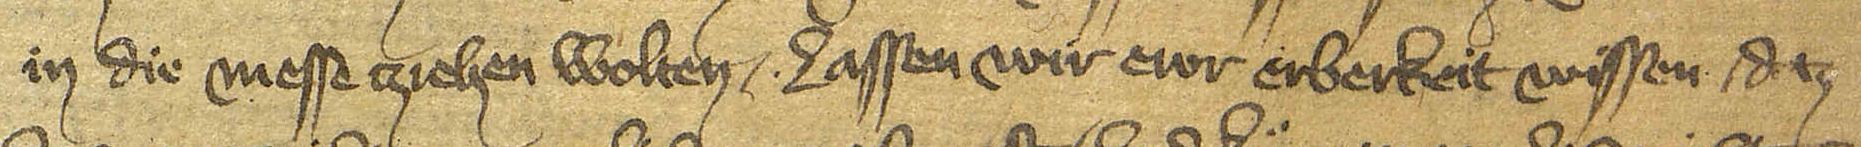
in die meſſe cʒiehen wolten / . Laſſen wir ewr erberkeit wiſſen / daʒ
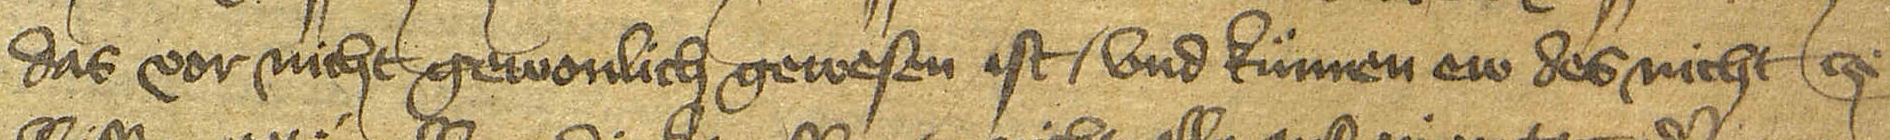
das vor nicht gewonlich geweſen iſt / vnd künnen ew des nicht cʒe
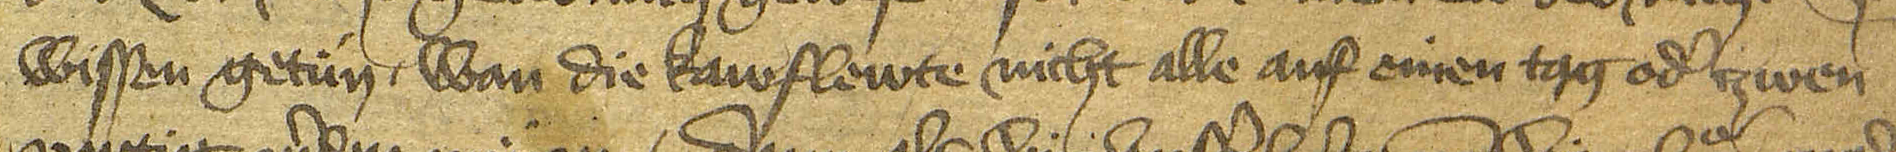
wiſſen getün / wan die kawflewte nicht alle auf einen tag od* cʒwen
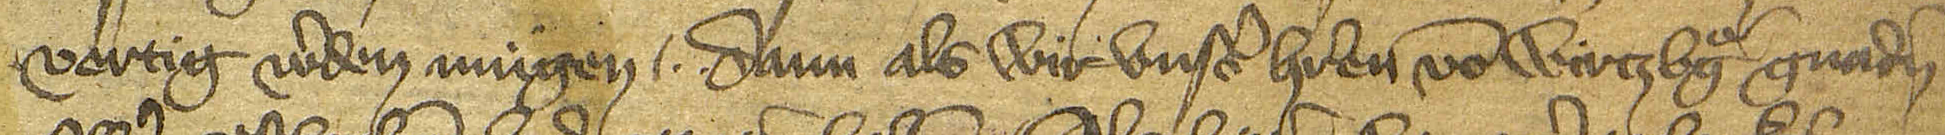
vertig w*den mügen / . Dann als wir vnſ*s hr*en vo* Wircʒbg* gnadn*
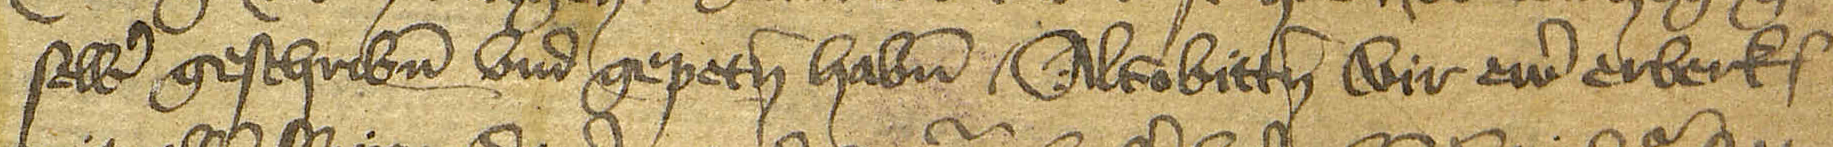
ſelb* geſchribn* vnd gepetn* habn* / Also bittn* wir ew* erberk*
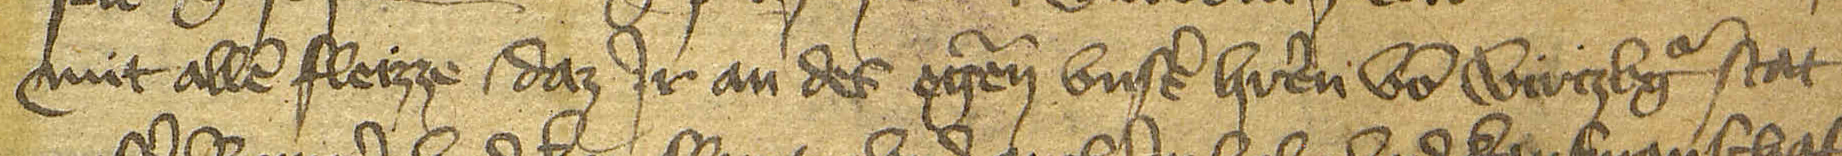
mit alle* fleiʒʒe / daʒ Ir an des egen* vnſs* hr*en vo* Wircʒbg* ſtat
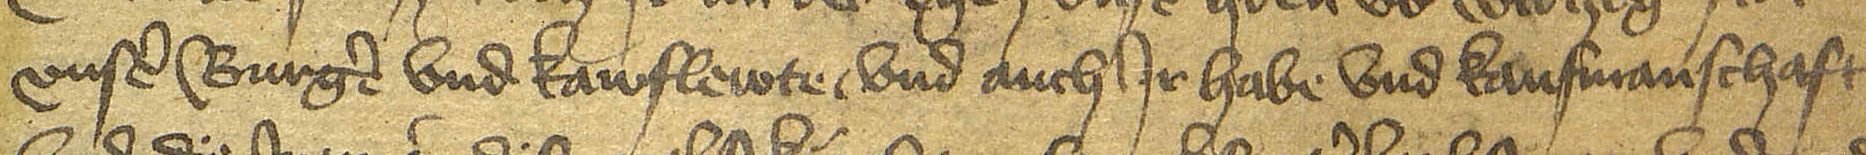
vnſe* Burge* vnd kawflewte / vnd auch Ir habe vnd kaufmanſchaft
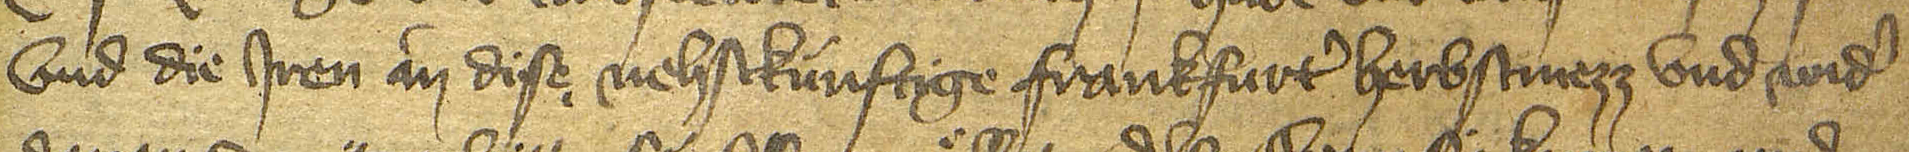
vnd die Iren in diſe nehſtkünftige frankfurt* herſtmeʒʒ vnd wid*
